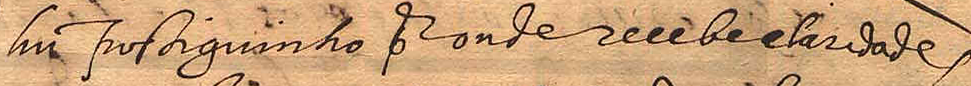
hū postiguinho pr onde recebe claridade/
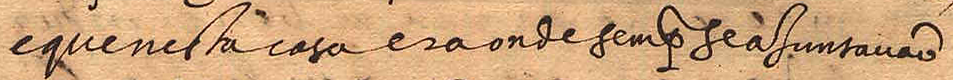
e que nesta casa era onde semp̄ se aJuntauão
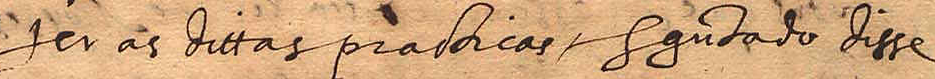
ter as dittas practicas / ꝑgūtado disse
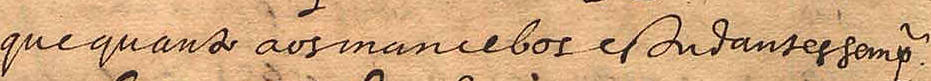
que quanto aos mancebos estudantes sempr
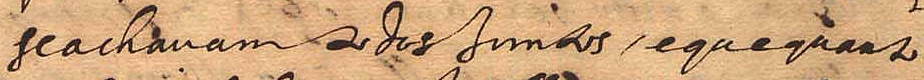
se achauam todos Juntos / e que quanto
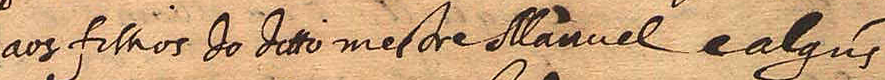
aos filhos do ditto mestre Manuel e algus̄
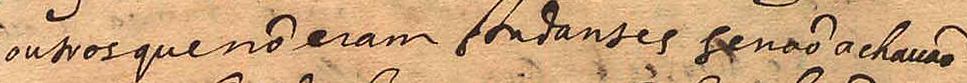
outros que nō eram studantes senaõ achauão
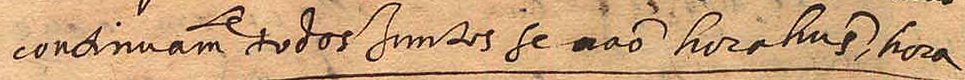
continuamte todos Juntos se naõ hora hus̄ / hora
